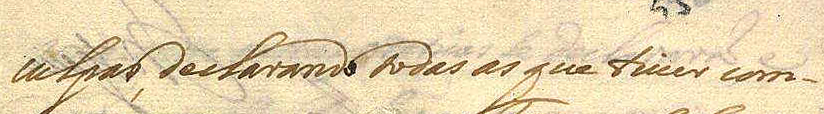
culpas declarando todas as que tiuer com
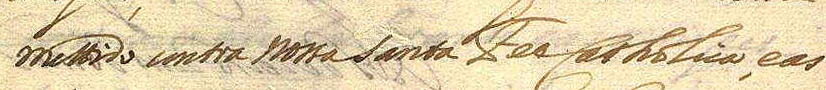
mettido contra nossa santa Fee Catholica, e as
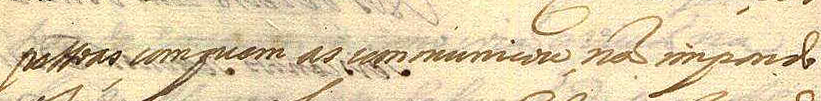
pessoas com quem as communicou, naõ impondo
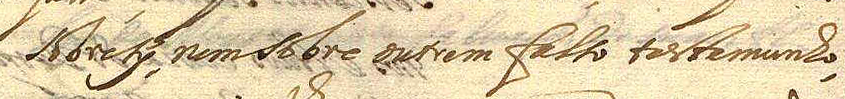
sobre sy, nem sobre outrem falso testemunho
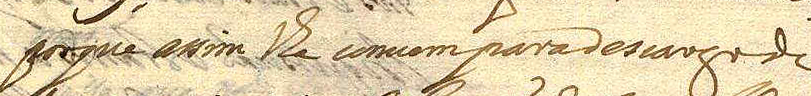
porque assim lhe conuem para descargo de
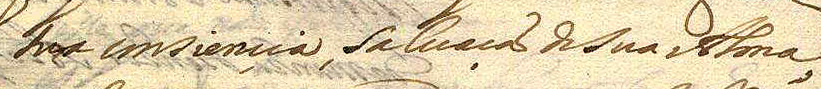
sua consiencia, saluaçaõ de sua Alma,
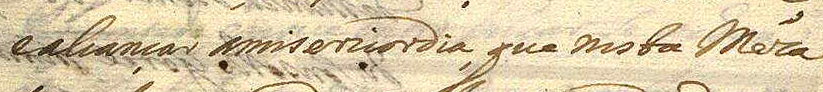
e alcançar a misericordia, que nesta Meza
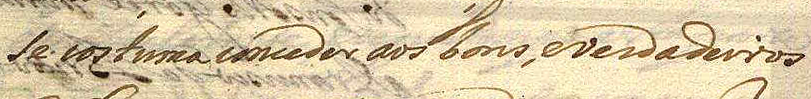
se costuma conceder aos bons, e verdadeiros
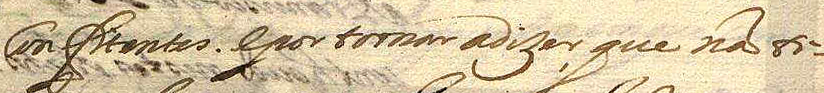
Confitentes. e por tornar a dizer que naõ ti
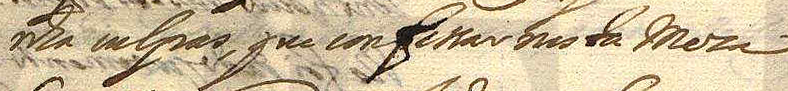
nha culpas, que confessar nesta Meza
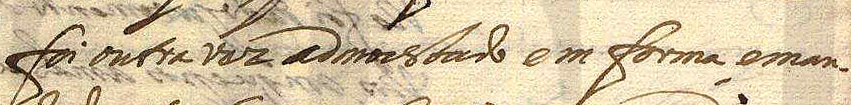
foi outra vez admoestado em forma e man
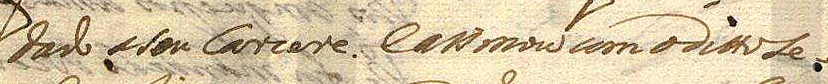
dado a seu Carcere. E assinou com o ditto se
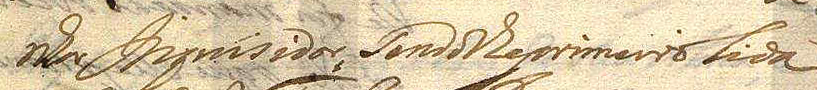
nhor Jnquisidor sendolhe primeiro lida
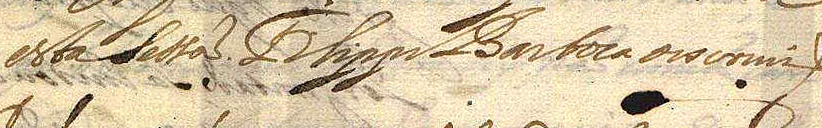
esta Sessaõ, Filippe Barboza o escreui
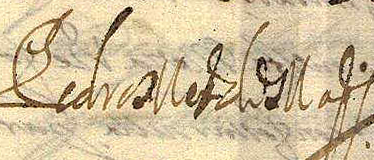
Pedro Mexa de Mages
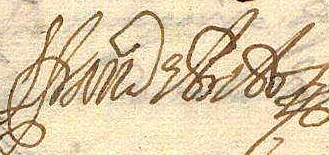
fran de Brito
